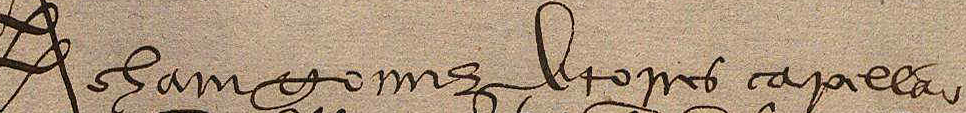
Joham gomez de torres capellão
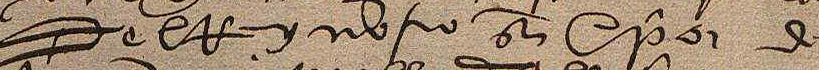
del Rey noso s̄or e p̄or de
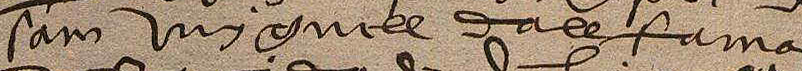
sam myguell dallfama
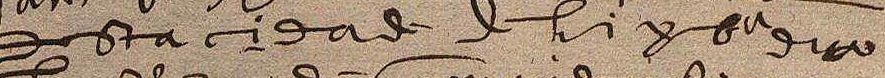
desta cidade de lixba digo
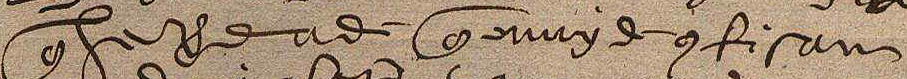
q̄ he ꝟdade q̄ ouuy de ꝯfisam
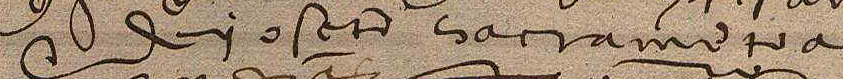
e dey o sctō sacramēto a
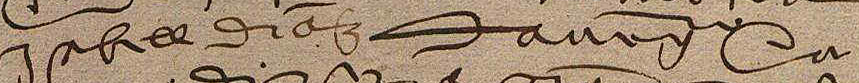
Jsabell diaz daueyro e a
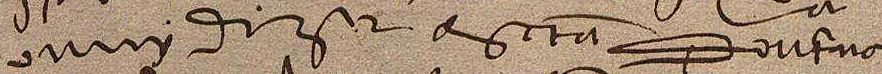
ouuy dizer a sctā Dout̄na
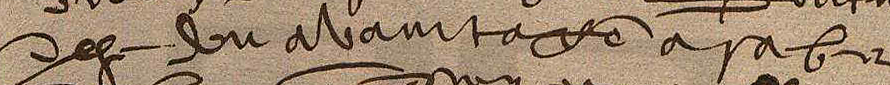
e lhe dou a vantagē a saber
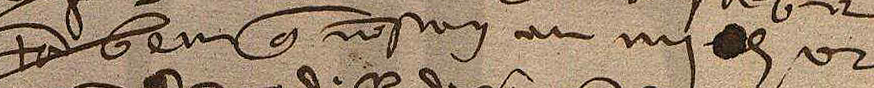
tābem q̄ nō sey eu mjlhor
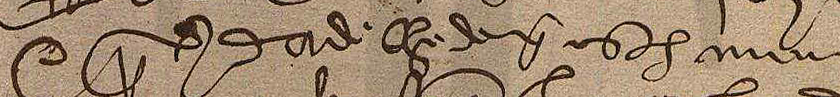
e p̄o ꝟdade lhe dey este meu
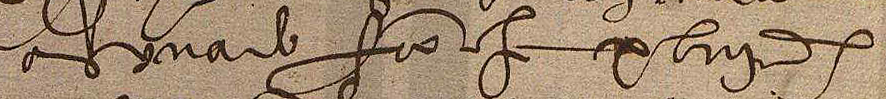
asynado fc̄o oJe xbiij dj
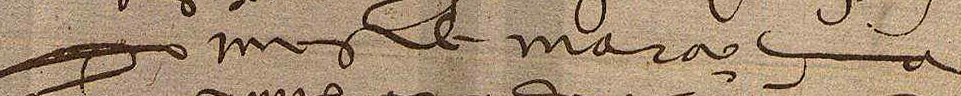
do mes de março da
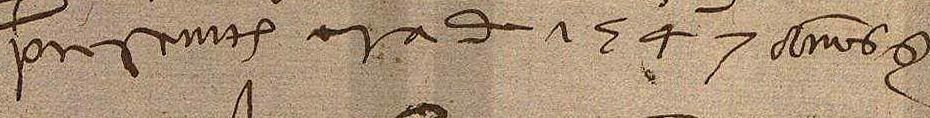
presemte era de 1547 An̄os
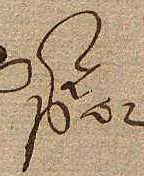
prior
